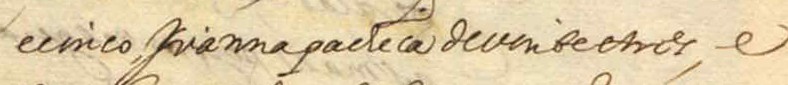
e cinco Joanna pacheca de vinte e tres, e
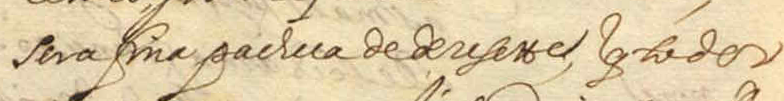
serafina pacheca de dezesette, q̄ todos
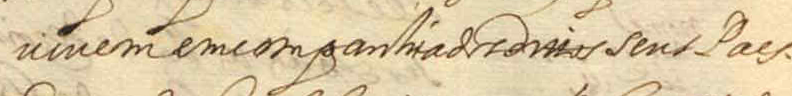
uiuem em companhia dos dittos seus Paes
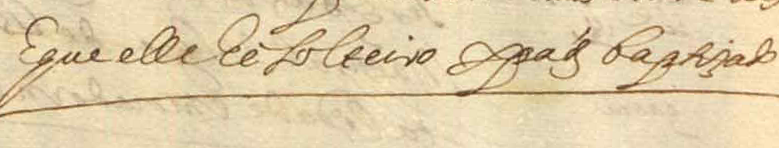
E que elle he solteiro xpaõ baptizado
